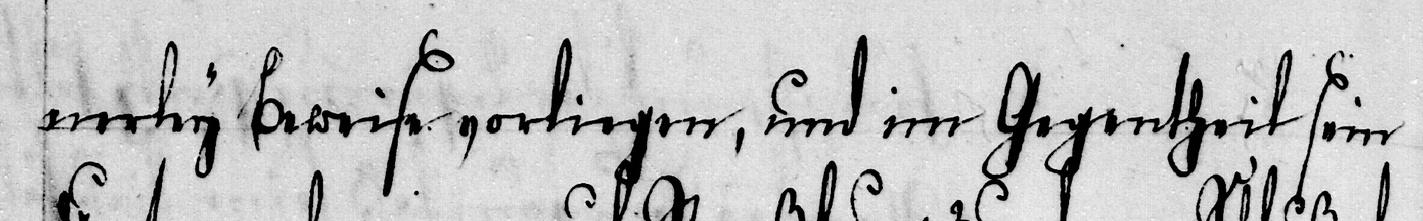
nerley Beweise vorliegen, und im Gegentheil sein
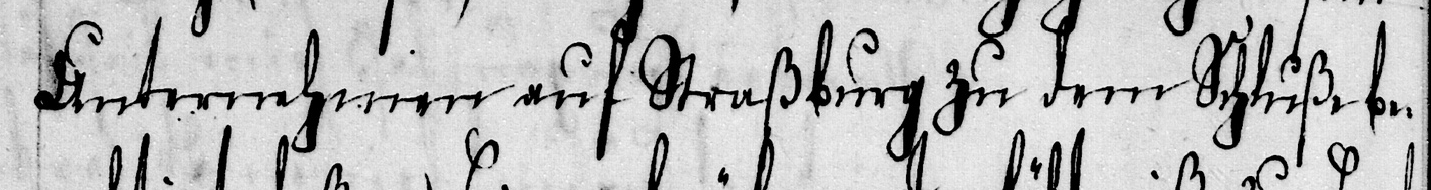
Unternehmen auf Straßburg zu dem Schluße be¬
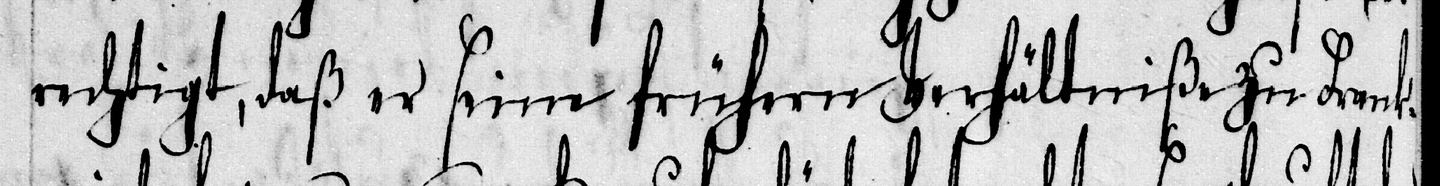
rechtigt, daß er seine frühern Verhältniße zu Frank¬
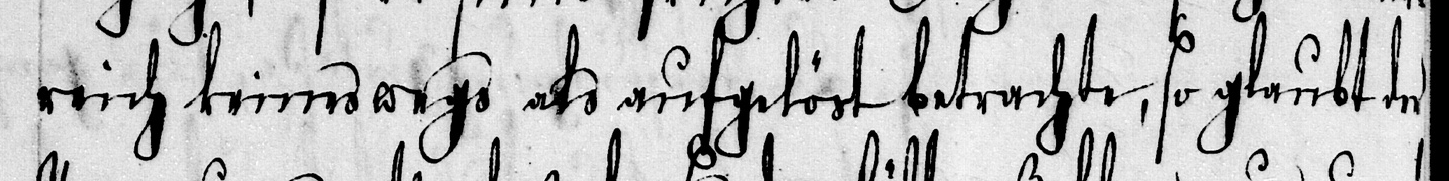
reich keineswegs als aufgelöst betrachte, so glaubt der
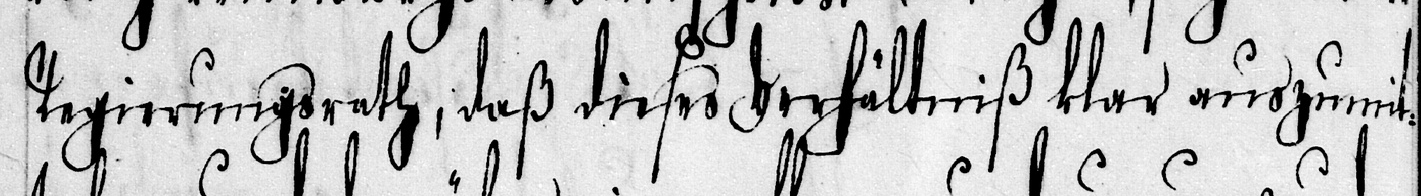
Regierungsrath, daß dieses Verhältniß klar auszumi¬
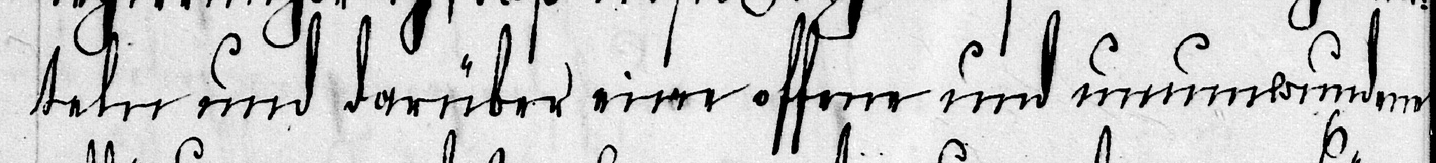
tteln und darüber eine offene und unumwundene
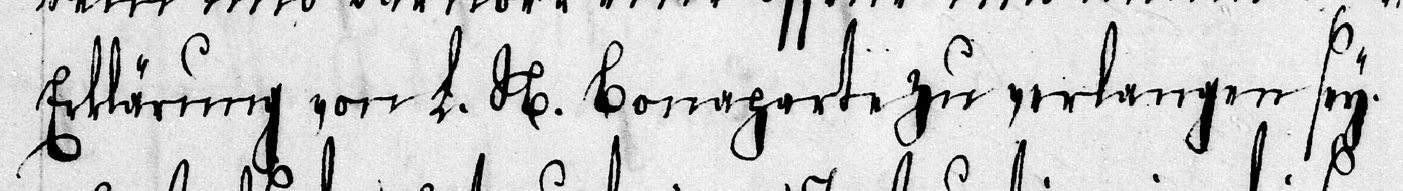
Erklärung von L. N. Bonaparte zu verlangen sey.
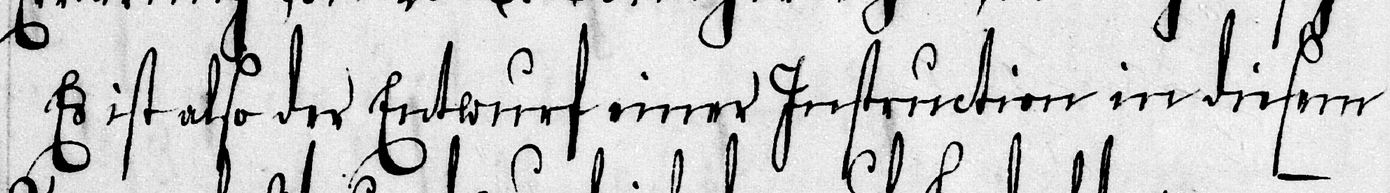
Es ist also der Entwurf einer Instruction in diesem
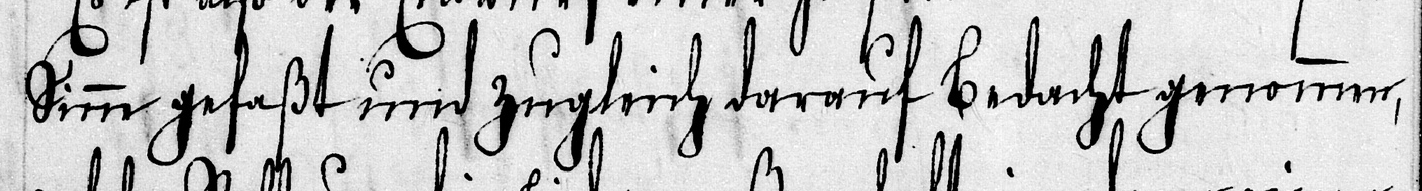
Sinne gefaßt und zugleich darauf Bedacht genommen,
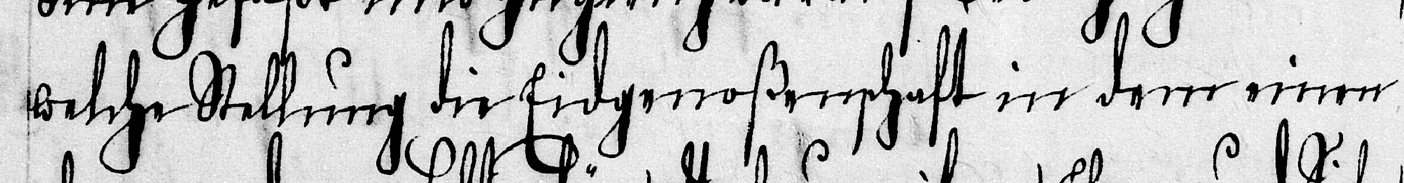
welche Stellung die Eidgenoßenschaft in dem einen
